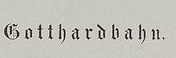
Gotthardbahn.
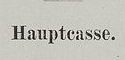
Hauptcasse.
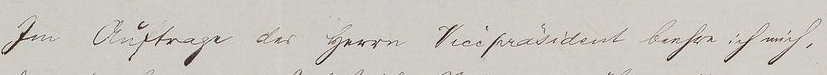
Im Auftrage des Herrn Vicepräsidenten beehre ich mich,
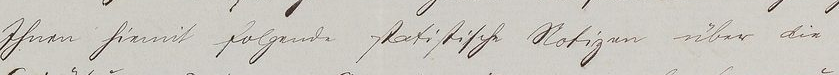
Ihnen hiemit folgende statistische Notizen über die
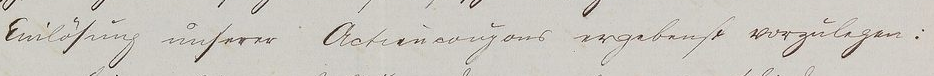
Einlösung unserer Actiencoupons ergebenst vorzulegen:
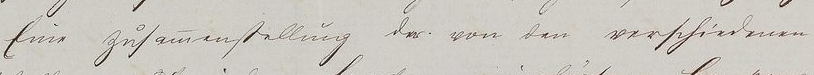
Eine Zusammenstellung der von den verschiedenen
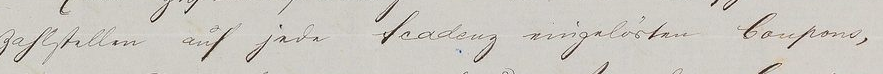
Zahlstellen auf jede Scadenz eingelösten Coupons,
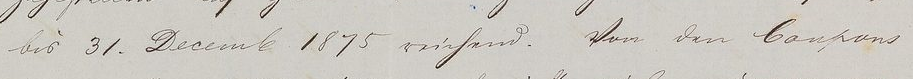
bis 31. Decemb 1875 reichend. Von den Coupons
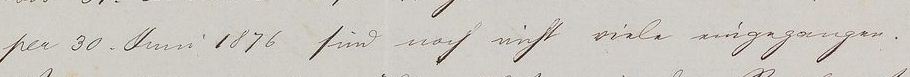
per 30 Juni 1876 sind noch nicht viele eingegangen.
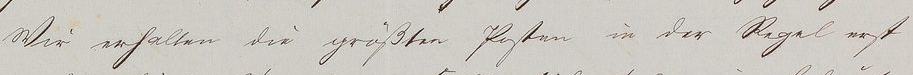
Wir erhalten die größten Posten in der Regel erst
